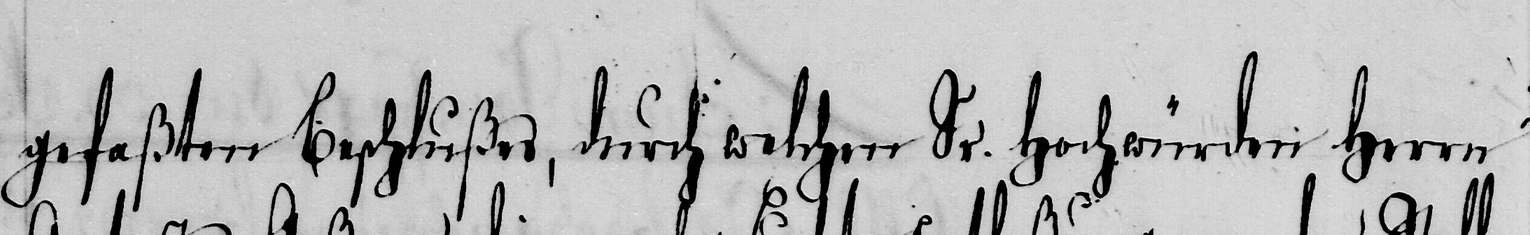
gefaßten Beschlußes, durch welchen Sr. Hochwürden Herrn
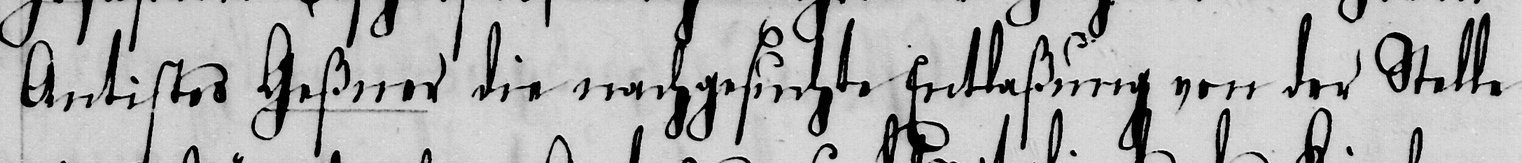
Antistes Geßner die nachgesuchte Entlaßung von der Stelle
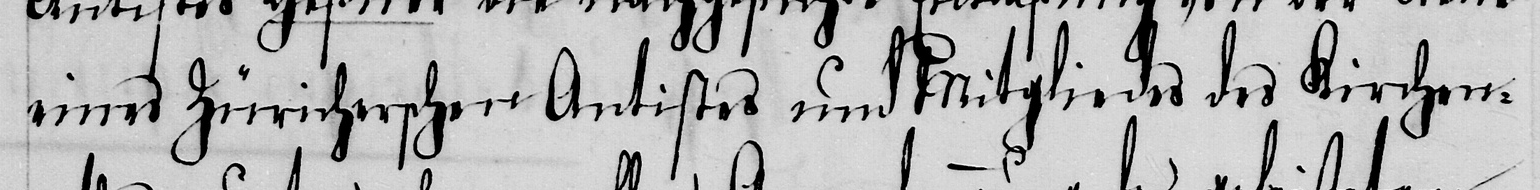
eines Züricherschen Antistes und Mitgliedes des Kirchen¬
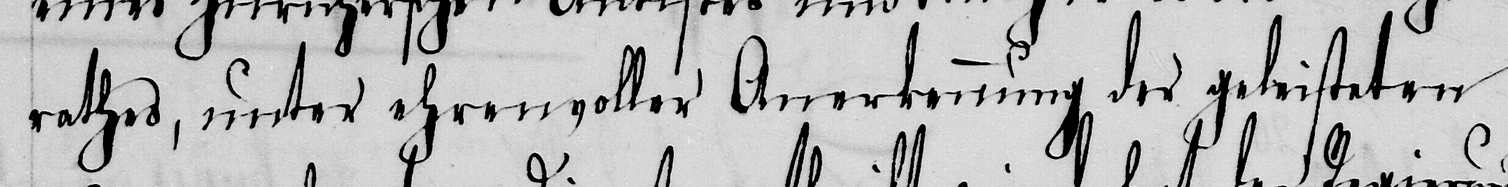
rathes, unter ehrenvoller Anerkennung der geleisteten
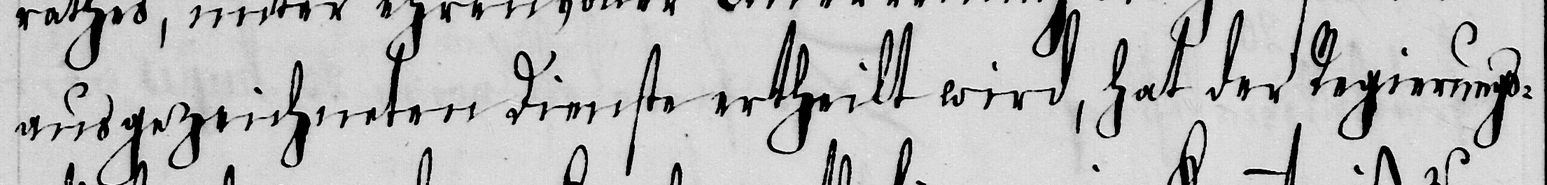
ausgezeichneten Dienste ertheilt wird, hat der Regierungs¬
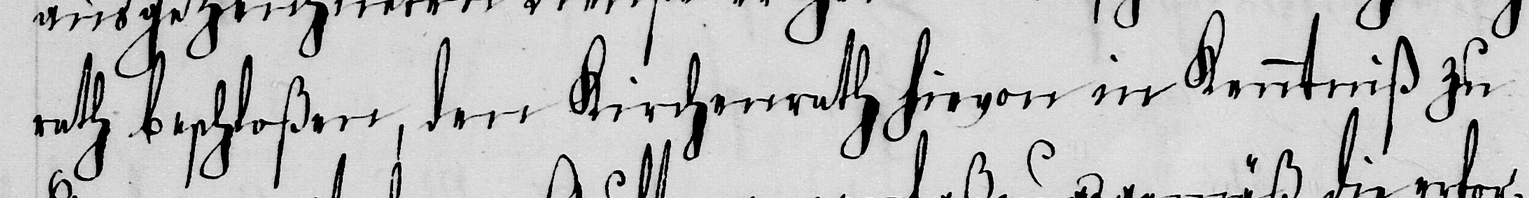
rath beschloßen, den Kirchenrath hievon in Kenntniß zu
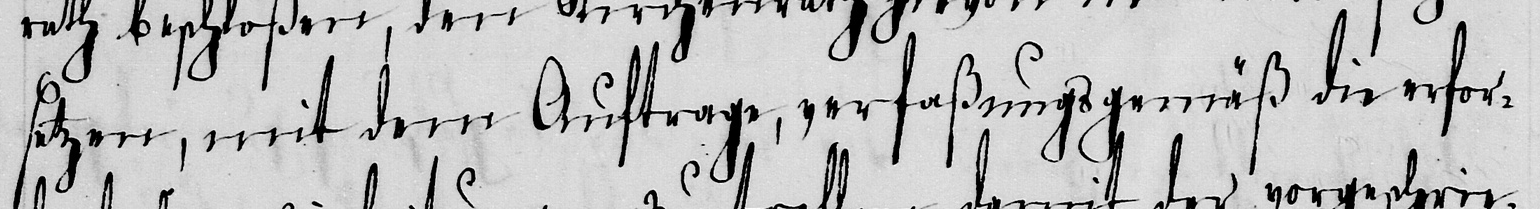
setzen, mit dem Auftrage, verfaßungsgemäß die erfor¬
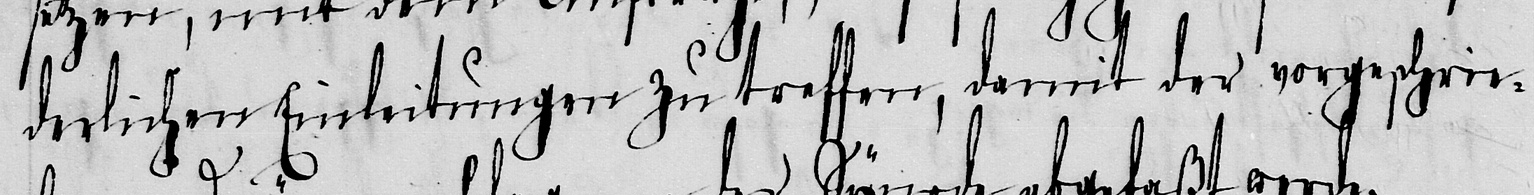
derlichen Einleitungen zu treffen, damit der vorgeschrie¬
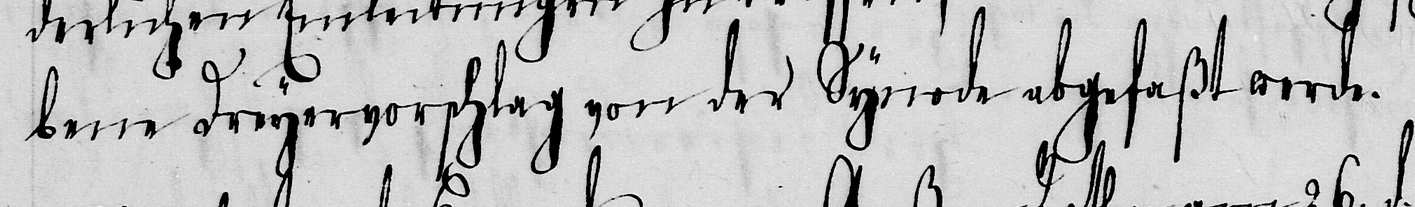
bene Dreyervorschlag von der Synode abgefaßt werde.
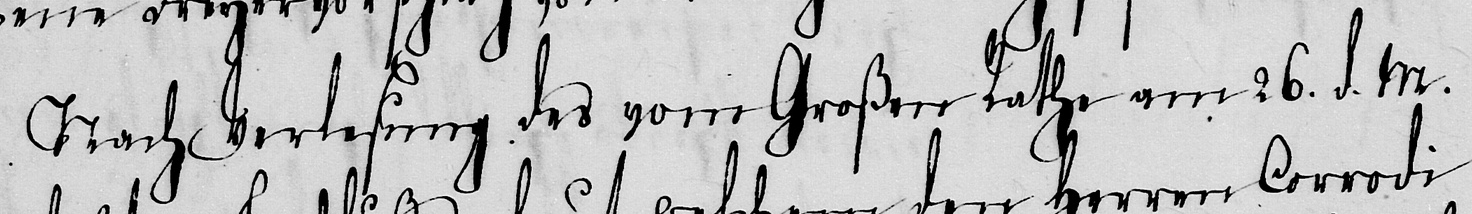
Nach Verlesung des vom Großen Rathe am 26. d. M.
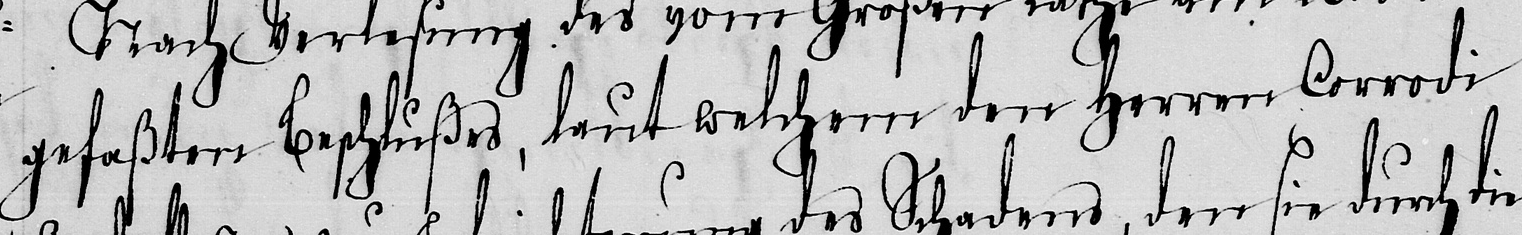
gefaßten Beschlußes, laut welchem den Herren Corrodi
